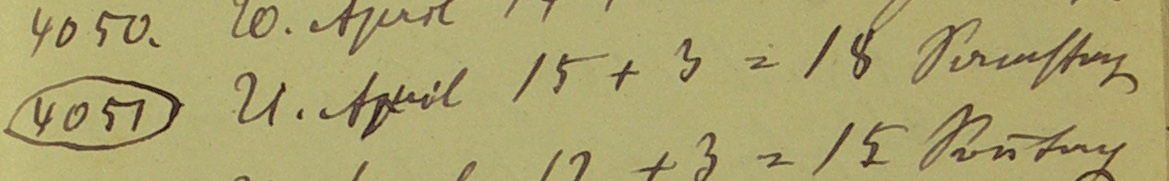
4051 21. April = 15 + 3 = 18. Samstag
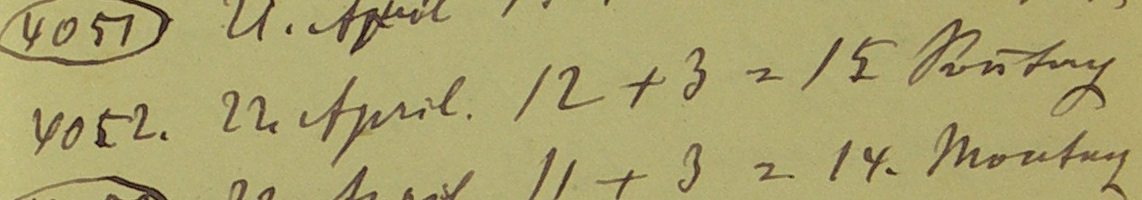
4052 22. April = 12 + 3 = 15. Sonntag
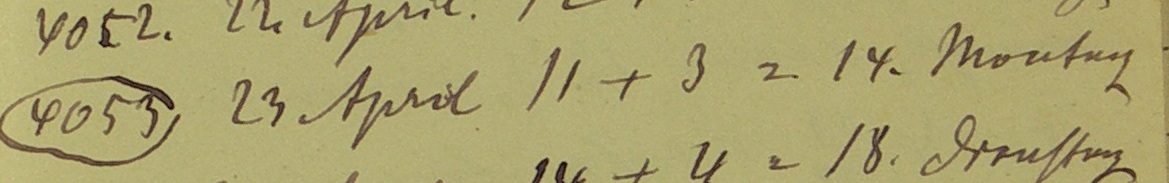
4053 23. April = 11 + 3 = 14. Montag
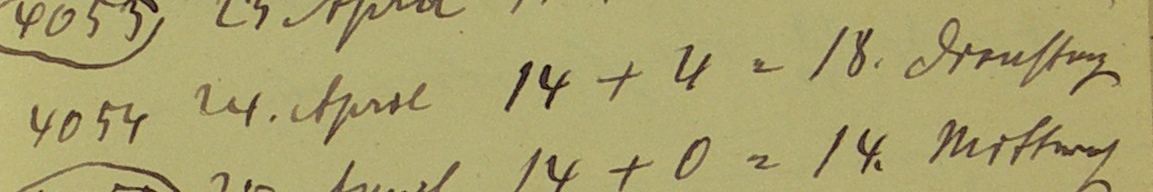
4054 24. April = 14 + 4 = 18. Dienstag
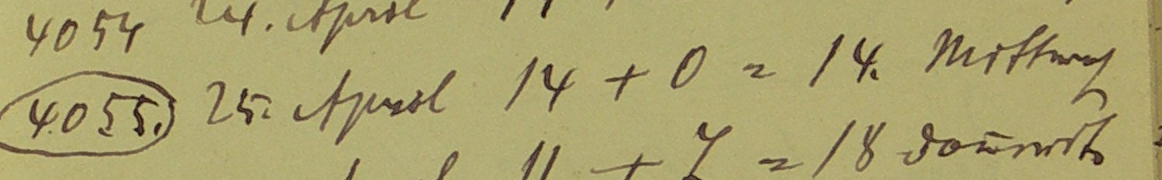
4055 25. April = 14 + 0 = 14. Mittwoch
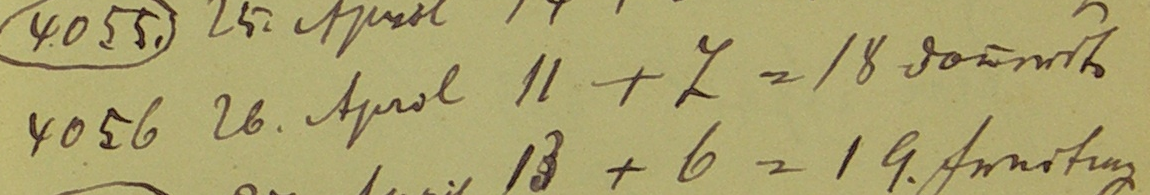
4056 26. April = 11 + 7 = 18. Donnerstag
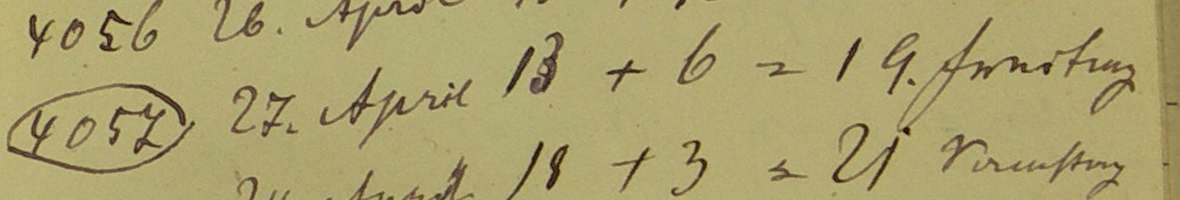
4057 27. April = 13 + 6 = 19. Freitag
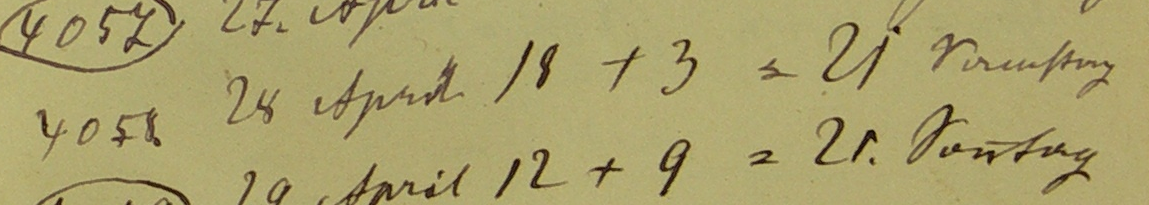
4058 28. April = 18 + 3 = 21. Samstag
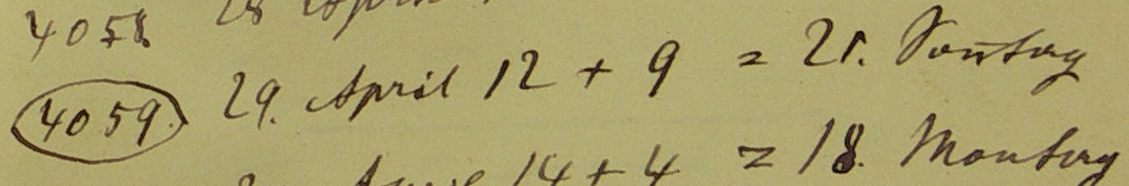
4059 29. April = 12 + 9 = 21. Sonntag
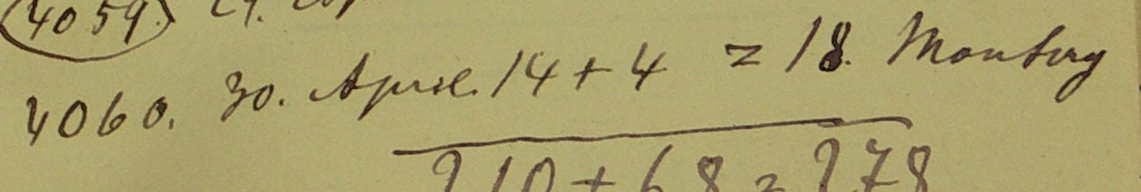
4060 30. April = 14 + 4 = 18. Montag
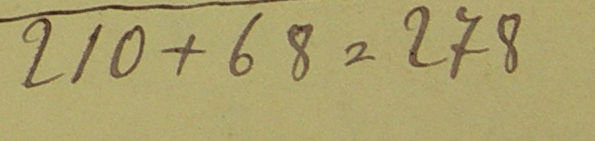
210 + 68 = 278
